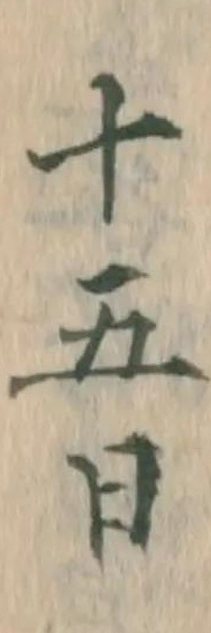十五日
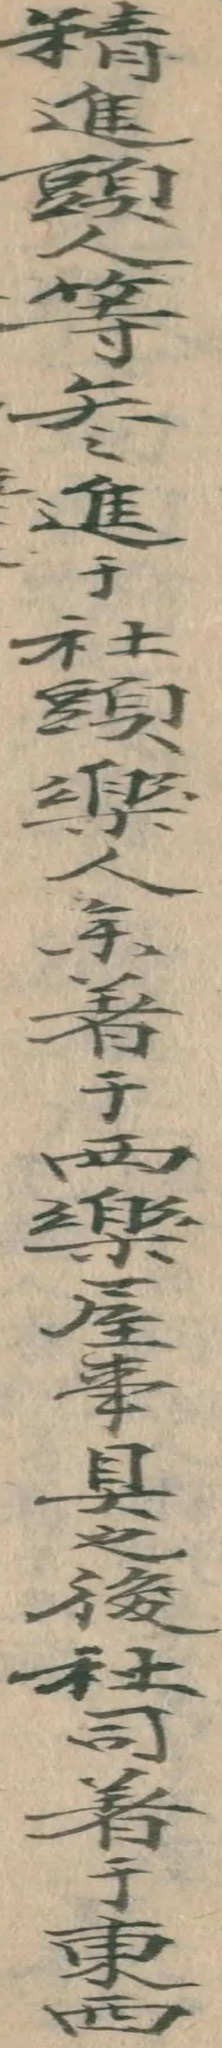精進頭人等参進于社頭楽人参着于西楽屋事具之後社司着于東西
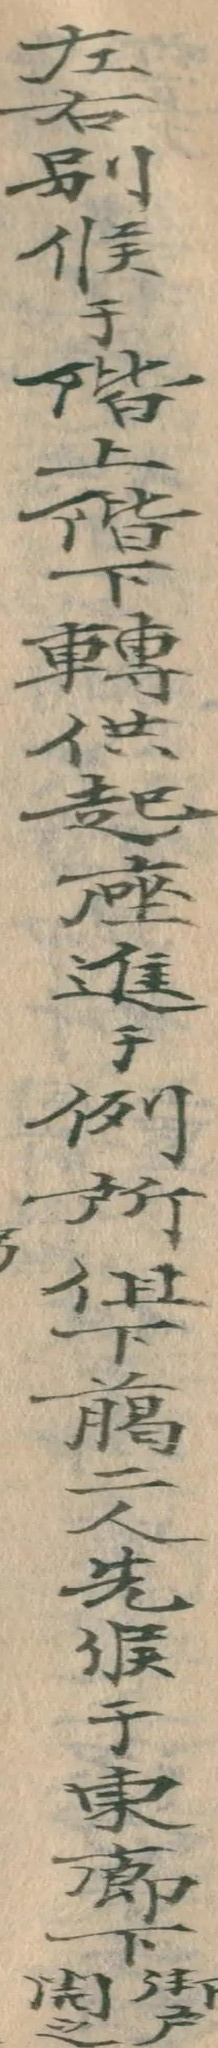左右別候于階上階下転供起座進于例所但下臈二人先候于東廊下御戸開之
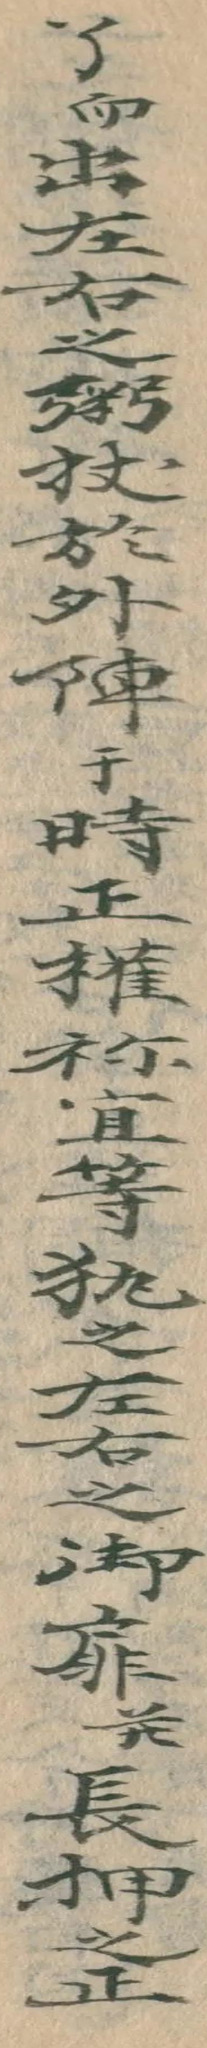了而出左右之粥杖於外陣于時正権祢宜等執之左右之御扉并長押之正

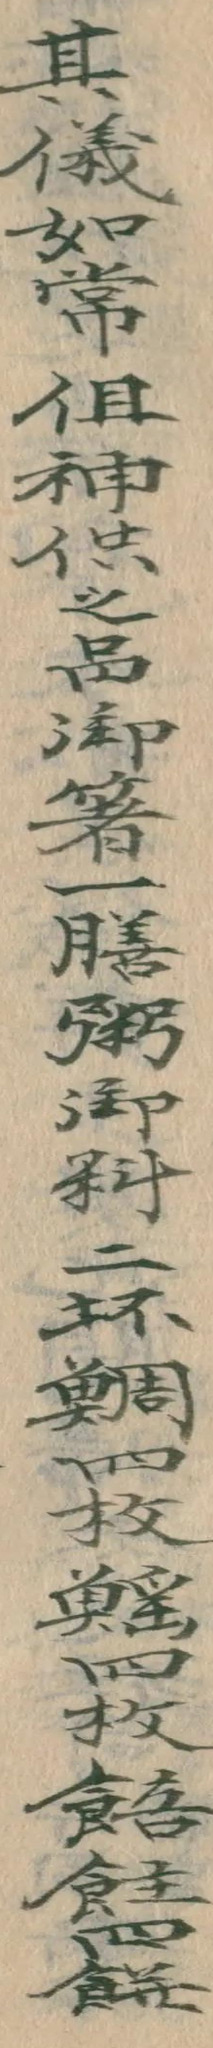其儀如常但神供之品御箸一膳粥御料二坏鯛四枚鰩四枚餢飳四餅

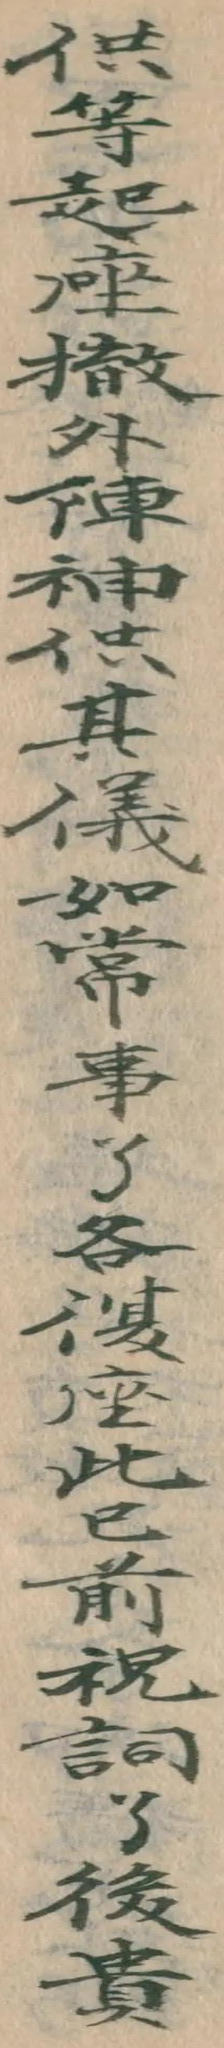供等起座撤外陣神供其儀如常事了各復座此已前祝詞了後貴
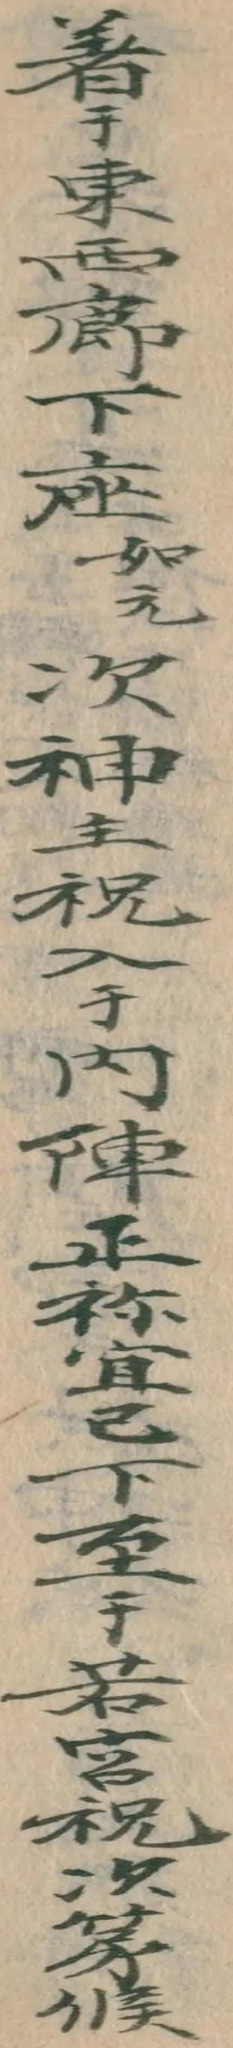着于東西廊下座如元次神主祝入于内陣正祢宜已下至于若宮祝次第候
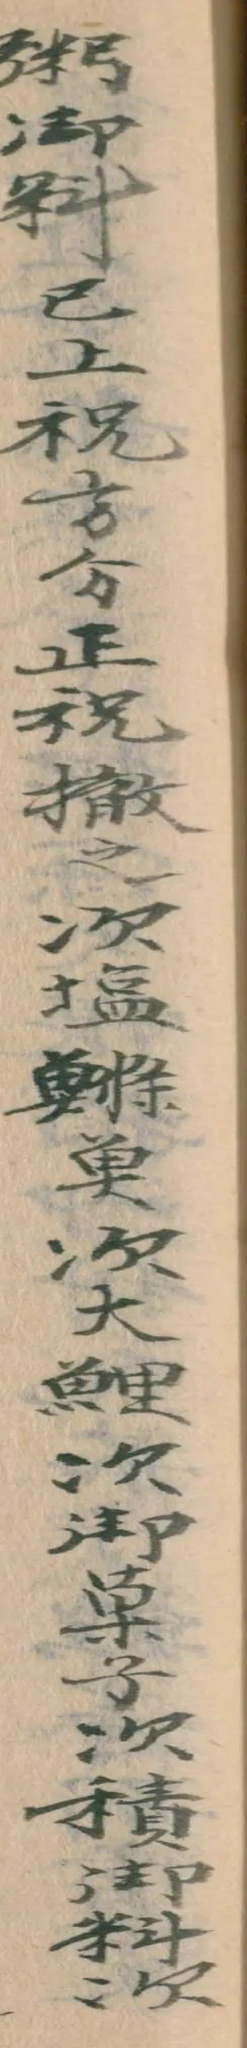粥御料已上祝方分正祝撤之次塩鰷魚次大鯉次御菓子次積御料次
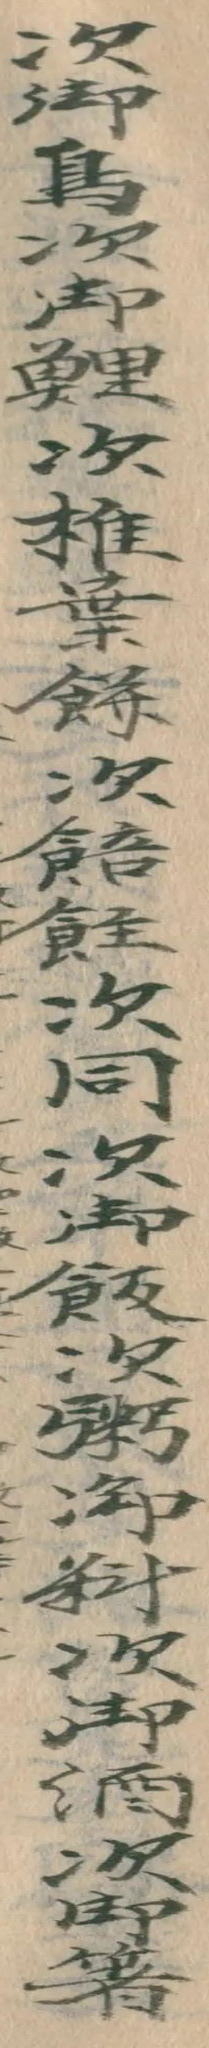次御鳥次御鯉次椎葉餅次餢飳次同次御飯次粥御料次御酒次御箸
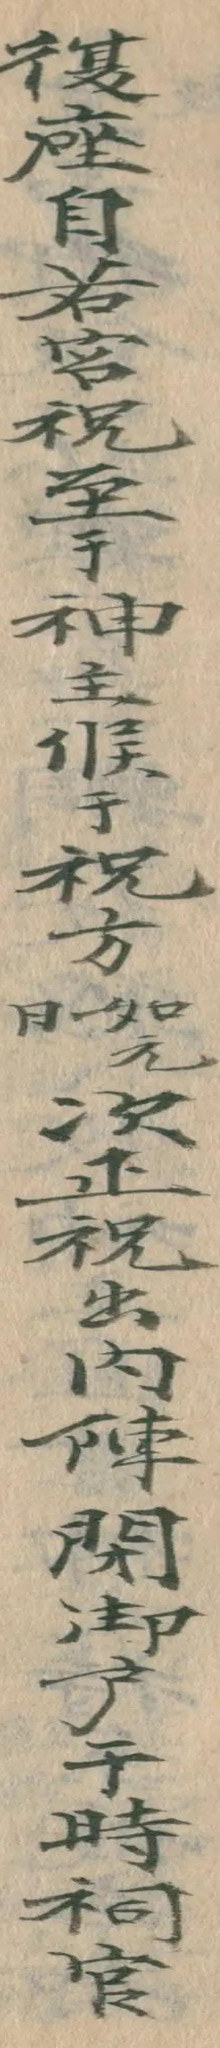復座自若宮祝至于神主候于祝方如元日次正祝出内陣閉御戸于時祠官

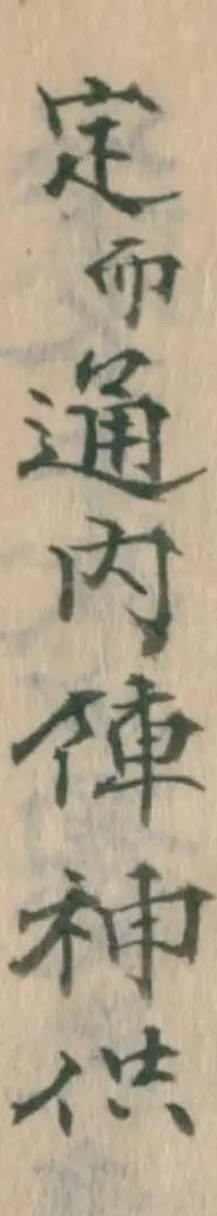定而通内陣神供
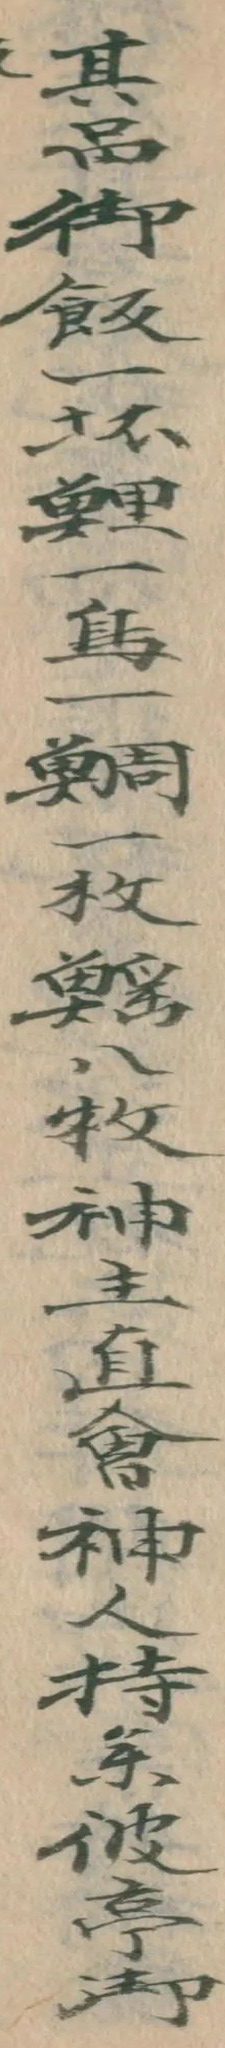其品御飯一坏鯉一鳥一鯛一枚鰩八枚神主直会神人持参彼亭御
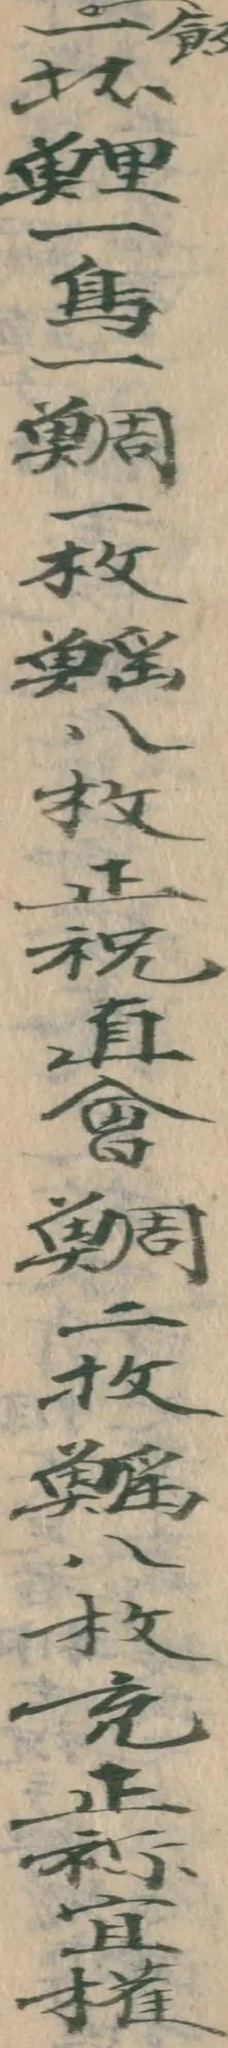◦一坏鯉一鳥一鯛一枚鰩八枚正祝直会鯛二枚鰩八枚充正祢宜権
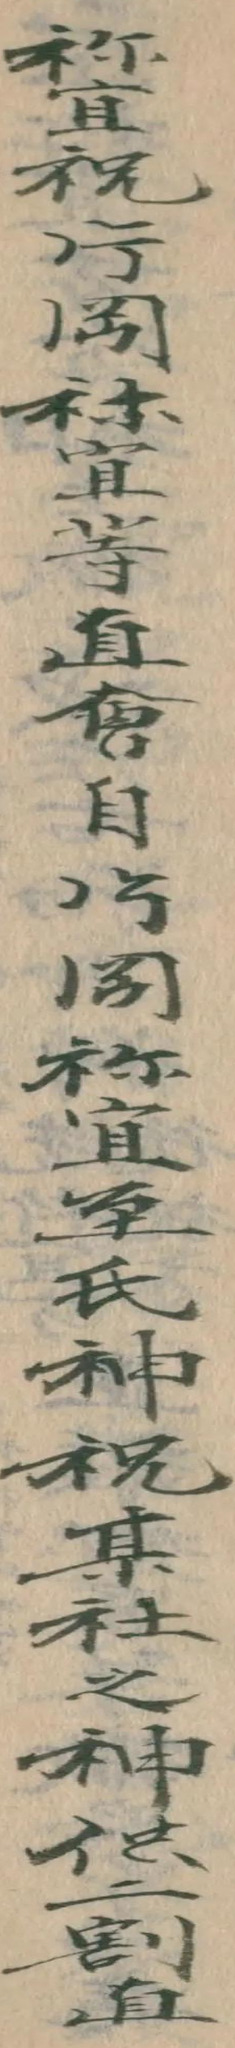祢宜祝片岡祢宜等直会自片岡祢宜至氏神祝某社之神供二割直
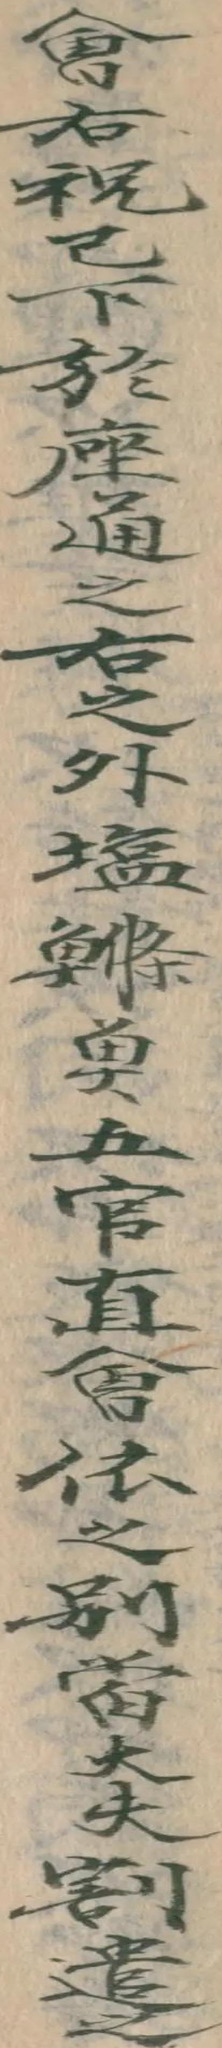会右祝已下於座通之右之外塩鰷魚五官直会依之別当大夫割遣之
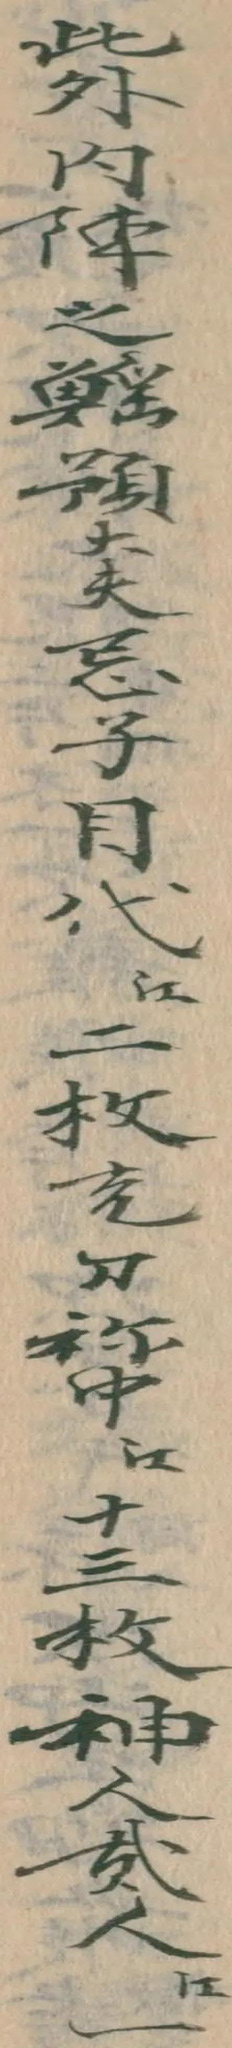此外内陣之鰩預大夫忌子目代江二枚充刀祢中江十三枚神人弐人江一
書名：賀茂社記録. 第9冊
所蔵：国立国会図書館 National Diet Library, JAPAN
